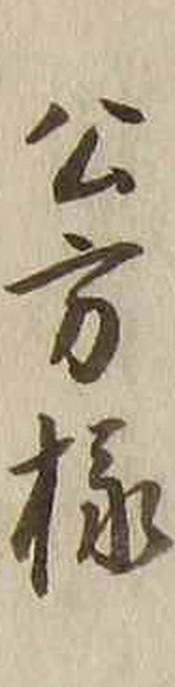公方様
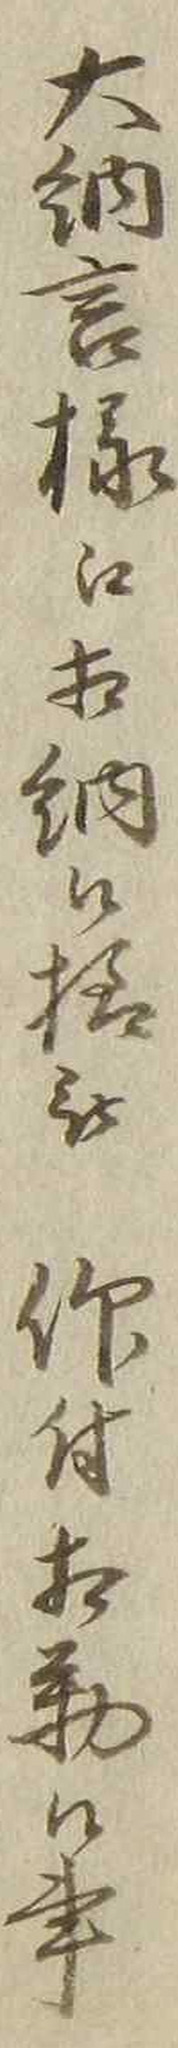大納言様江相納候様被仰付相勤候事
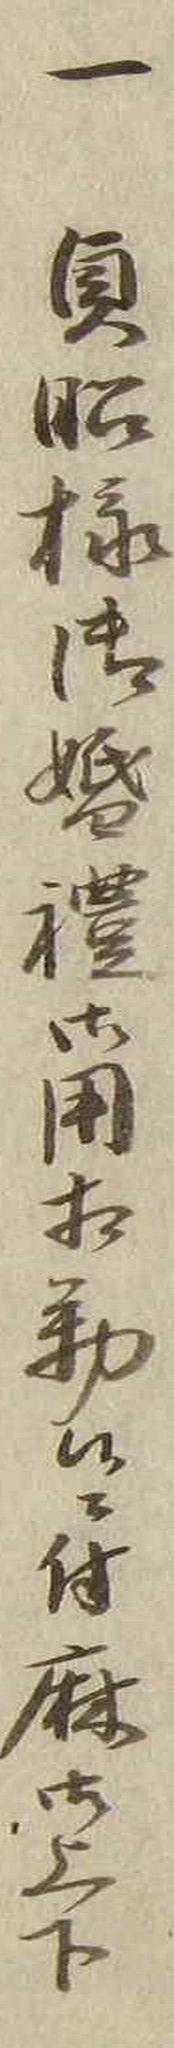一貞昭様御婚礼御用相勤候に付麻御上下

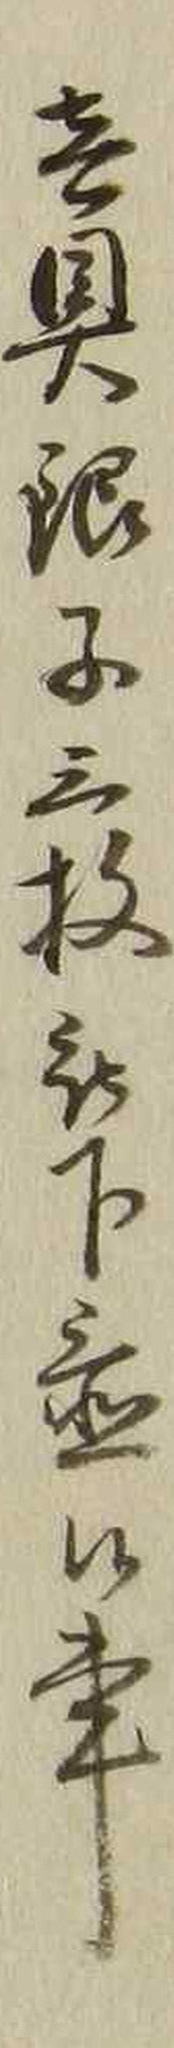壱具銀子三枚被下置候事
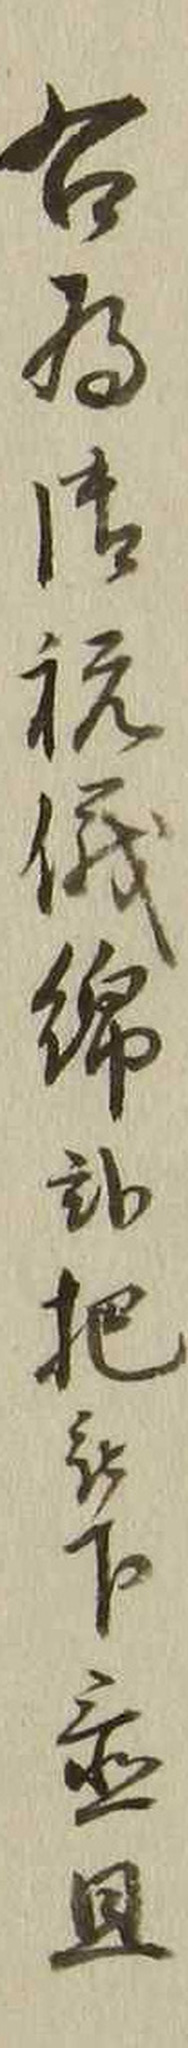右為御祝儀綿弐把被下置且
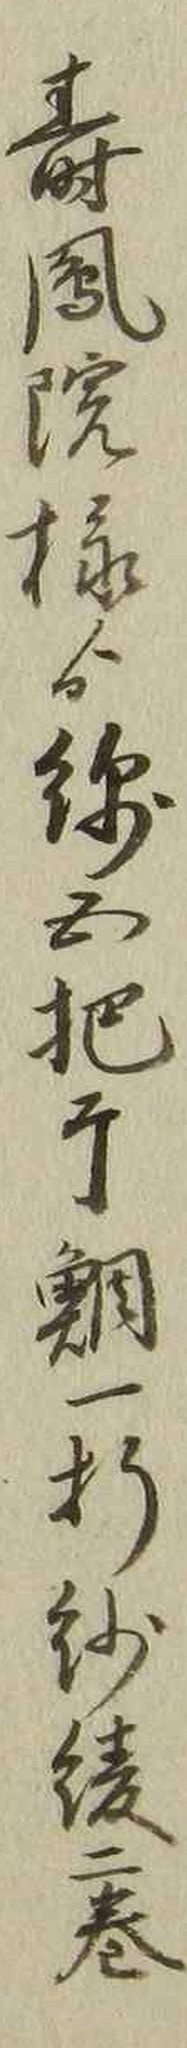寿鳳院様ゟ綿五杷干鯛一折紗綾二巻
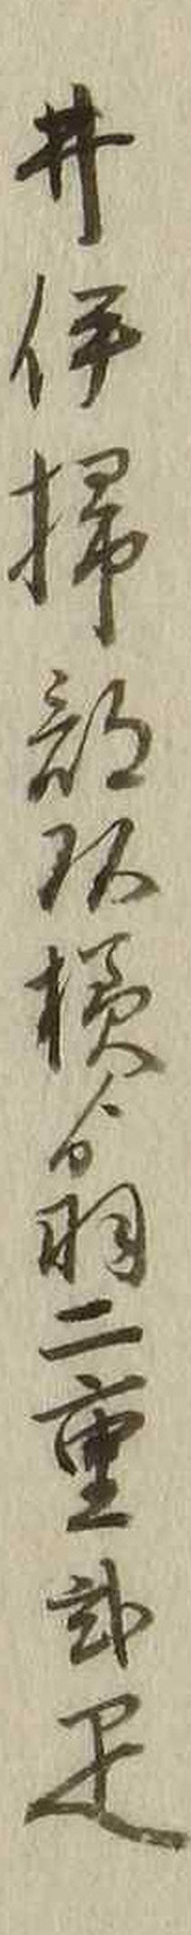井伊掃部頭様ゟ羽二重弐疋
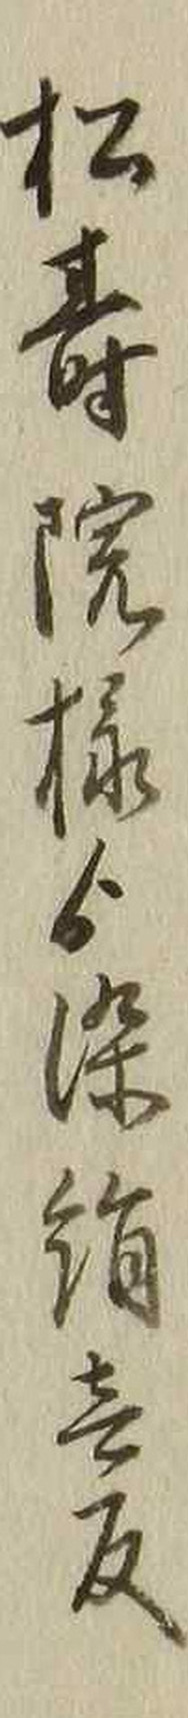松寿院様ゟ染絹壱反
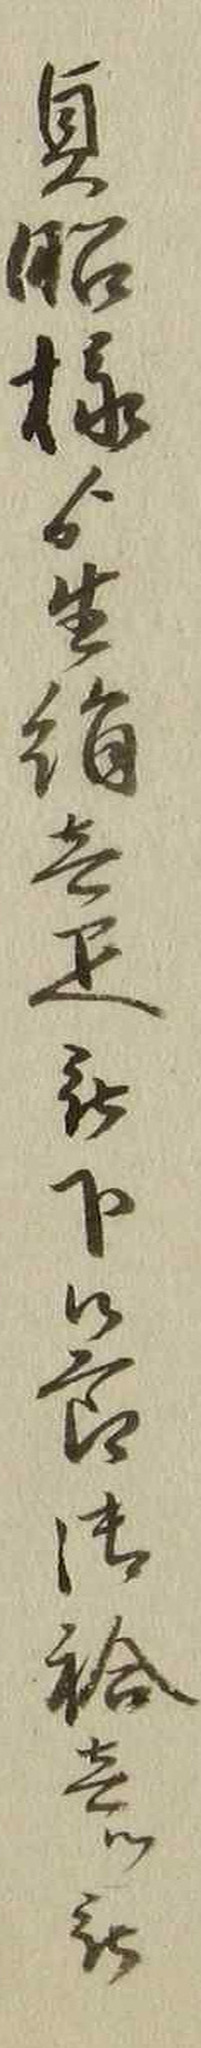貞昭様ゟ生絹壱疋被下候節御袷壱つ被
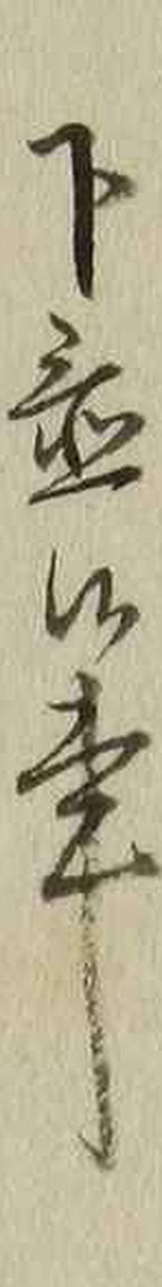下置候事
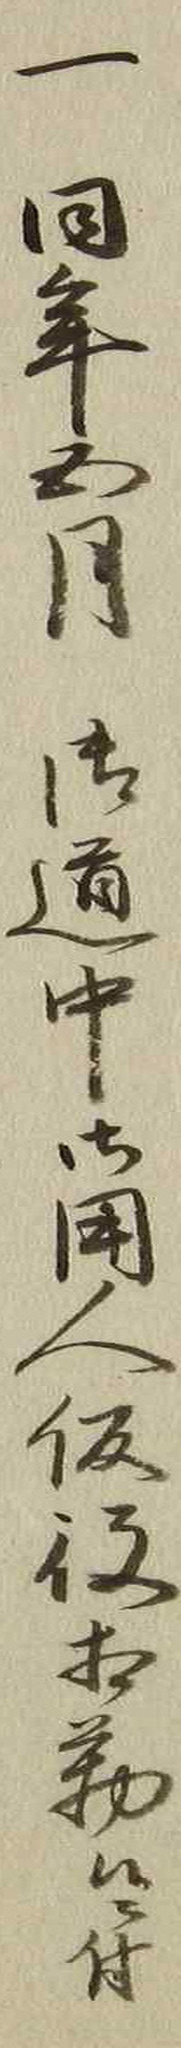一同年五月御道中御用人仮役相勤候に付
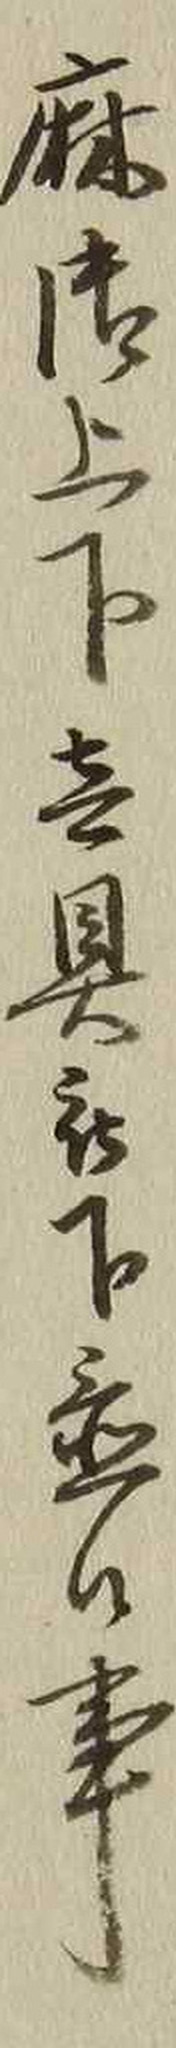麻御上下壱具被下置候事
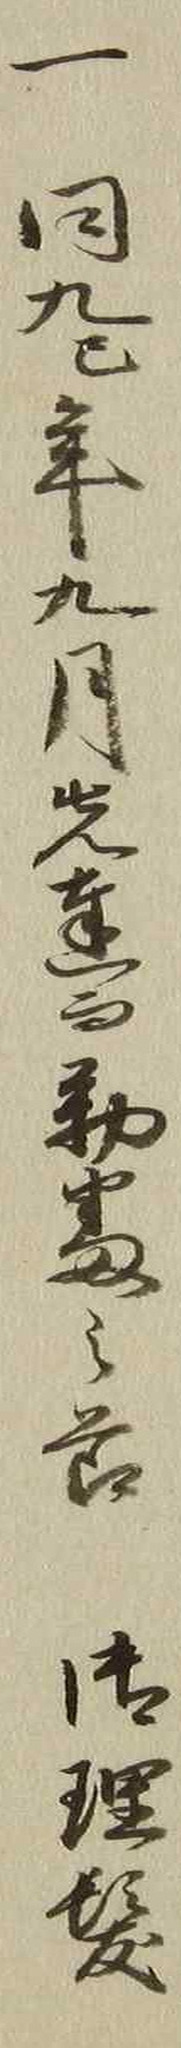一同九巳年九月先達而勤番之節御理髪
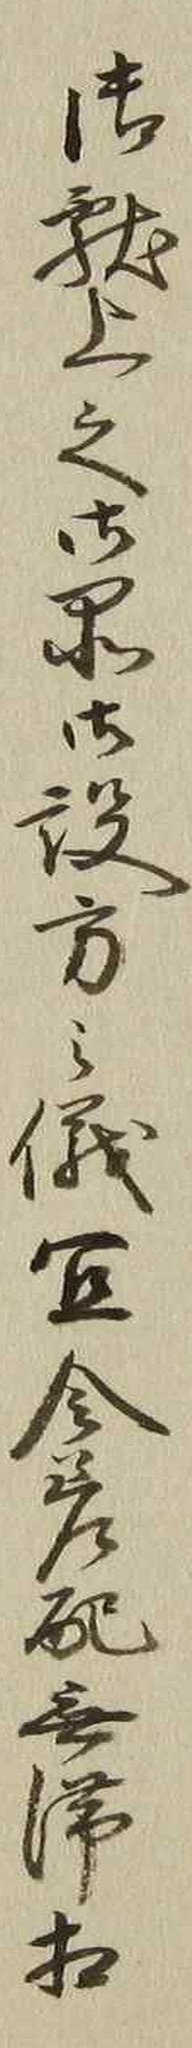御献上之御品御設方之儀宜令差配無滞相
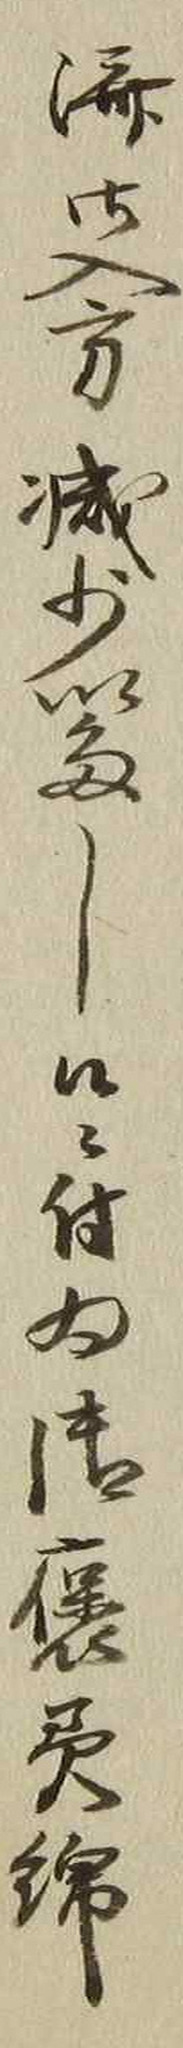済御入方減少いたし候に付為御褒美綿
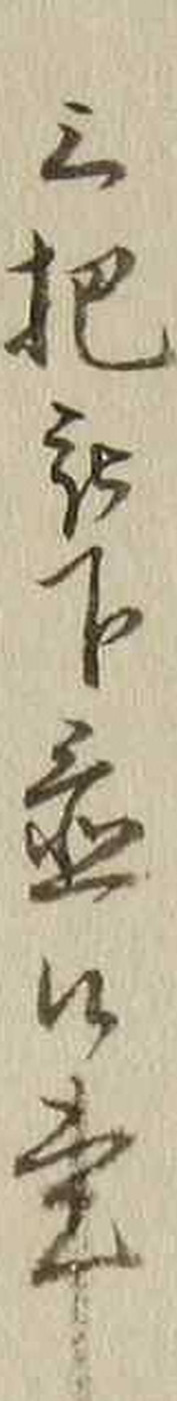三把被下置候事
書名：諸士系譜　巻之133　た之部9
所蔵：会津若松市立会津図書館
